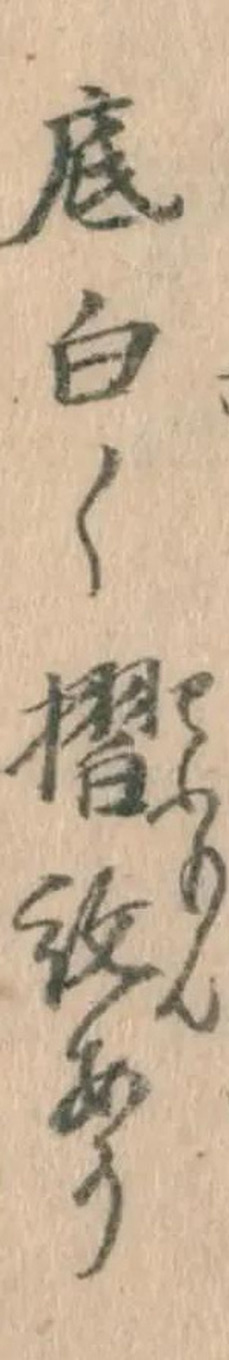底白く摺紋あり
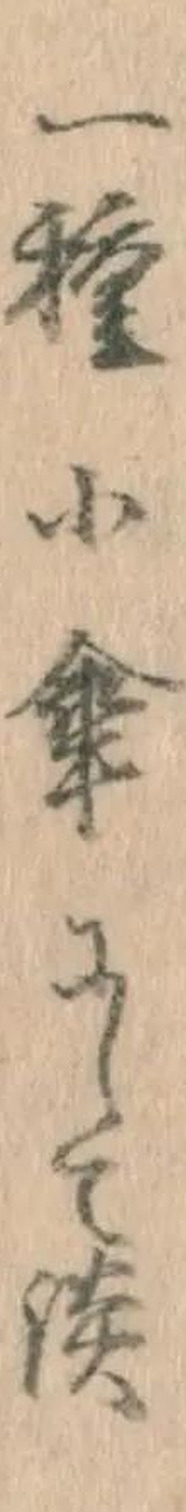一種小傘にして淡
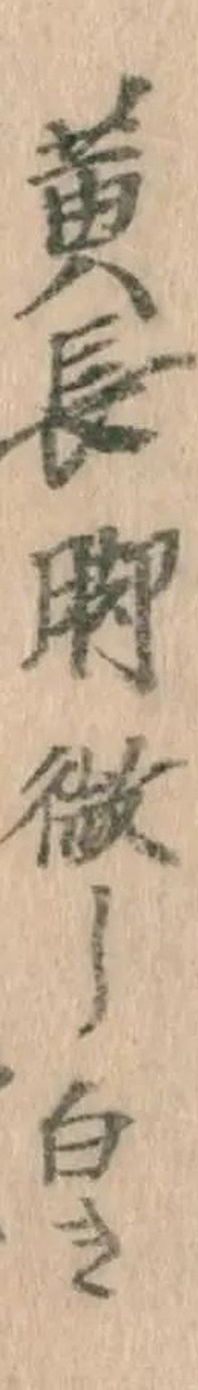黄長脚微し白き
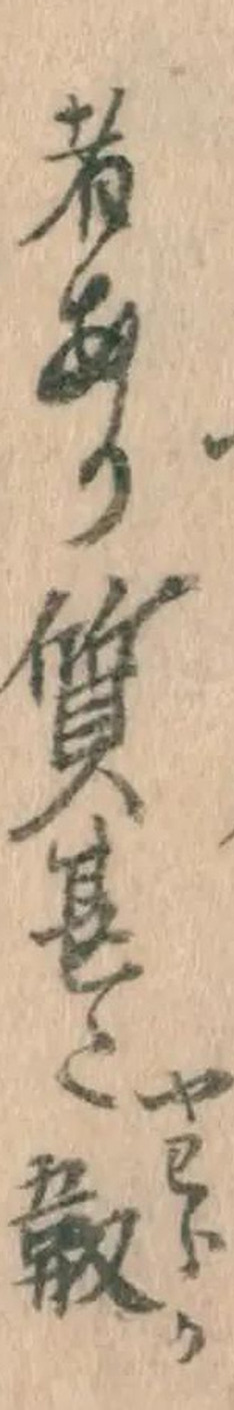者あり質甚た韌
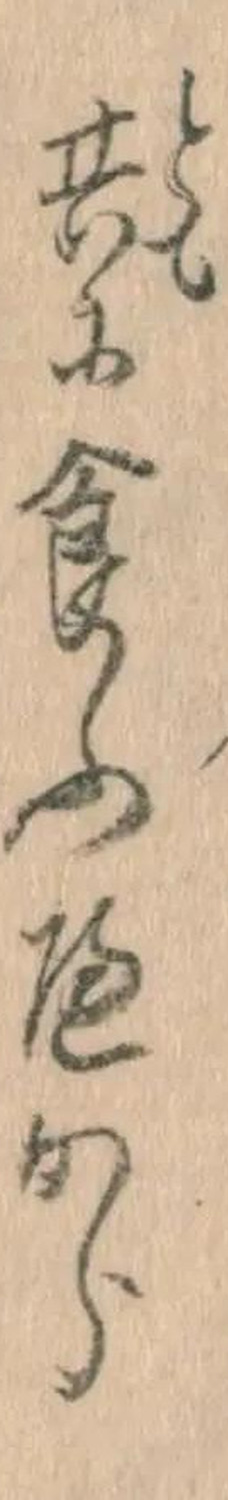共に食ふへから
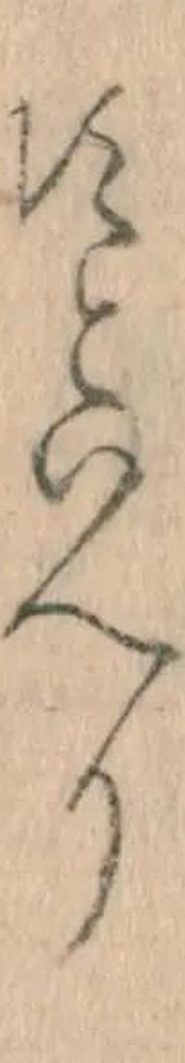すといへり
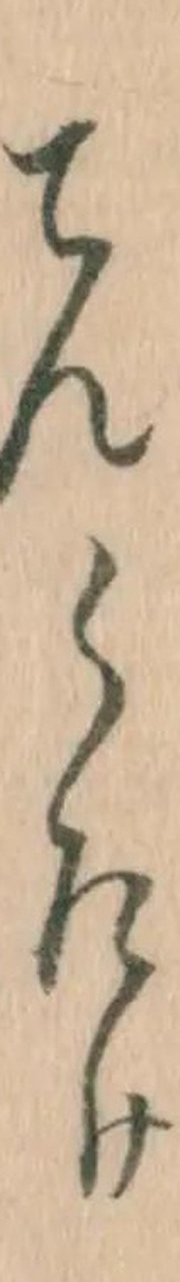てんくたけ
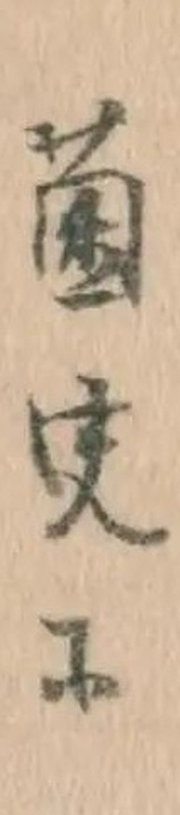菌史に
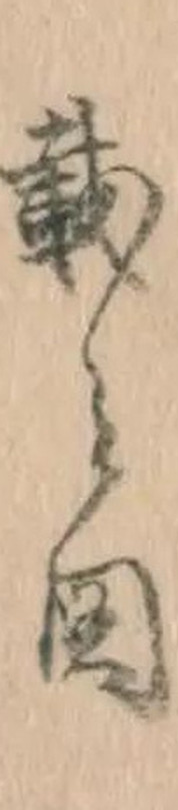載る図

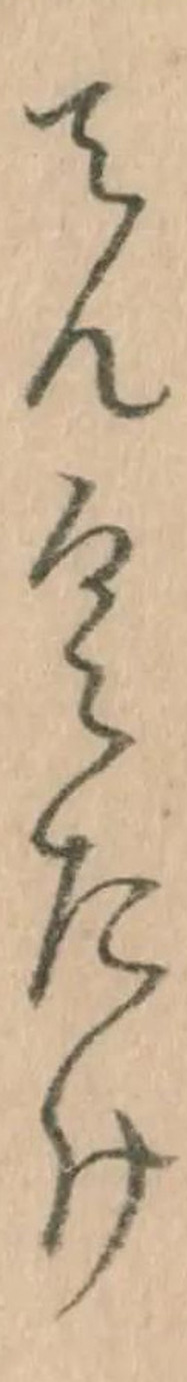てんくたけ
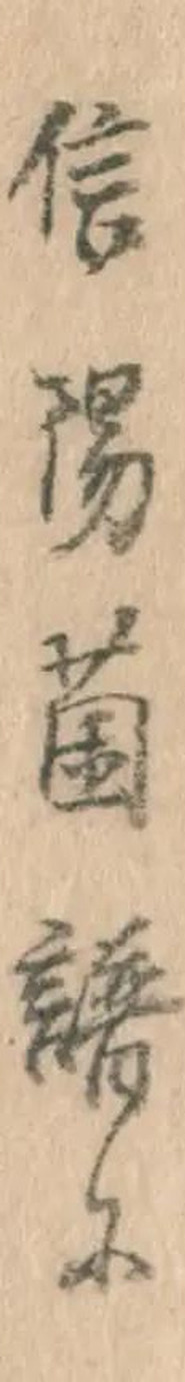信陽菌譜に
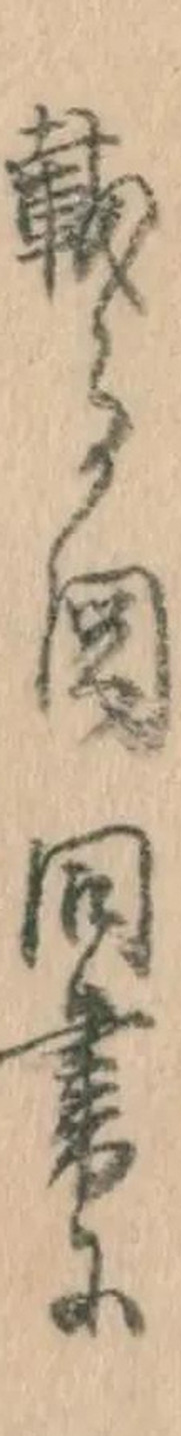載る図同書に
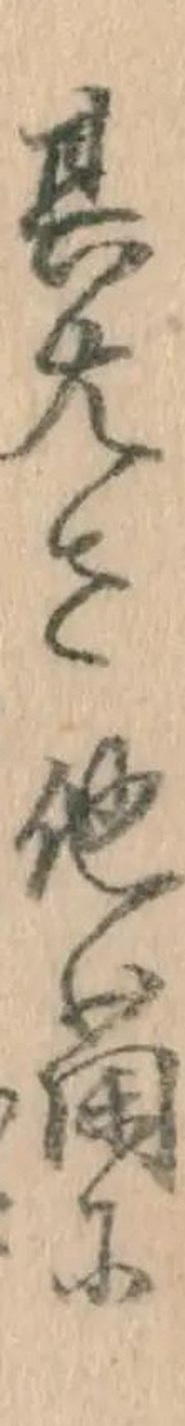其大さ他菌に
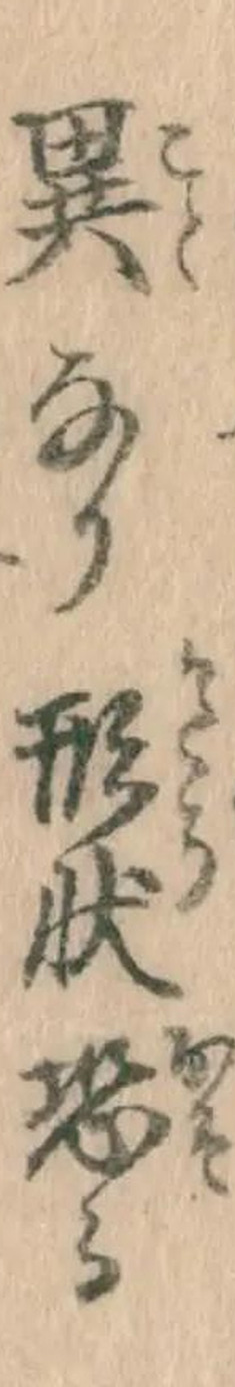異なり形状恐る
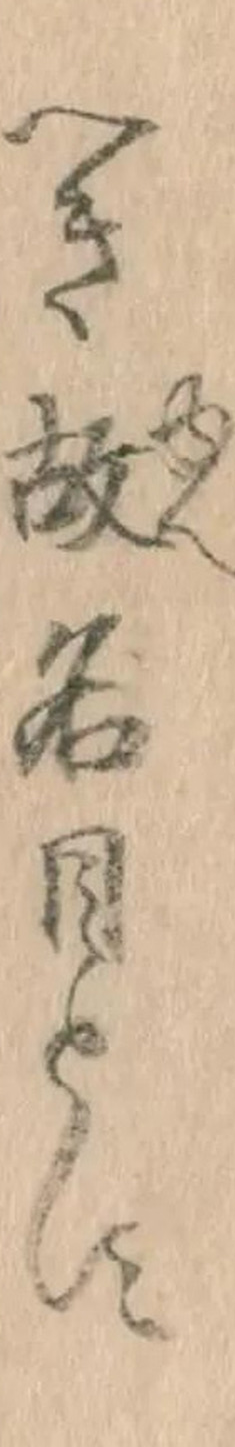へき故名目とす
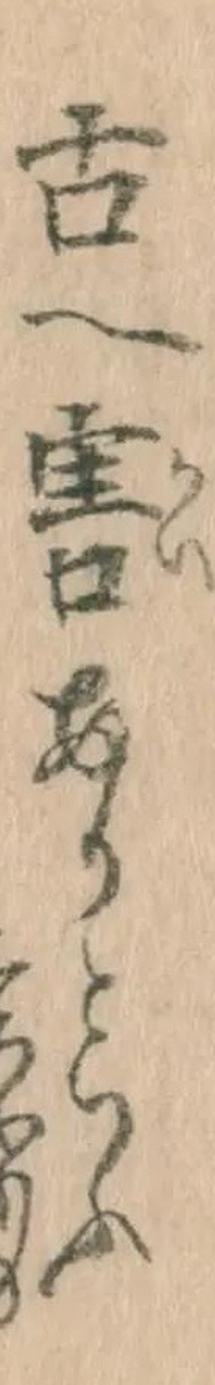古へ害ありといふ
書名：本草図譜. 巻58-60
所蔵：国立国会図書館 National Diet Library, JAPAN
